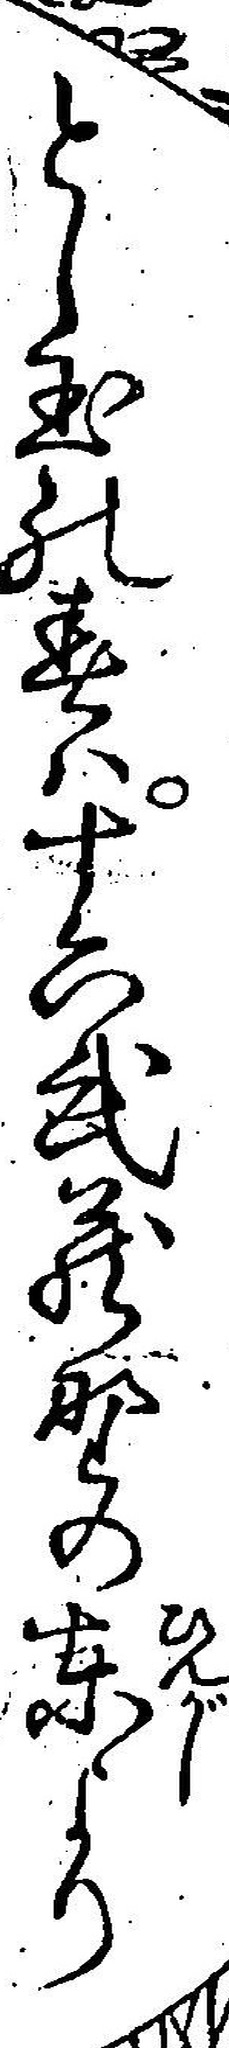とし玉の春は。十六武蔵野の東より
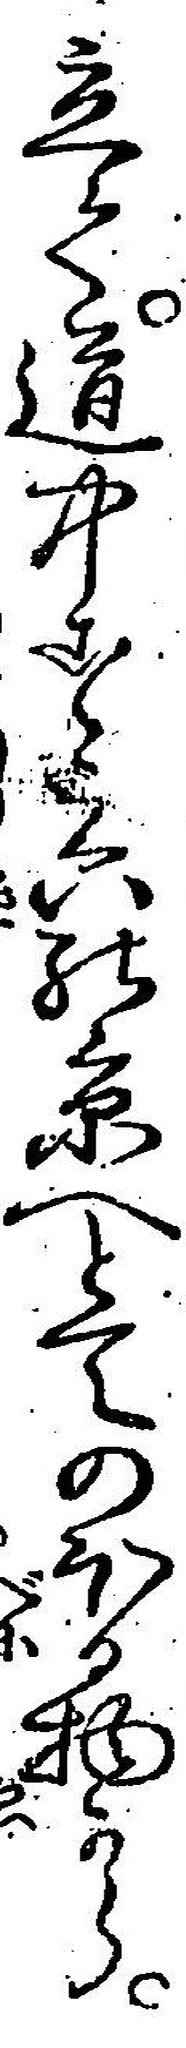立て。道中すこ六の京へとてのほる物から。
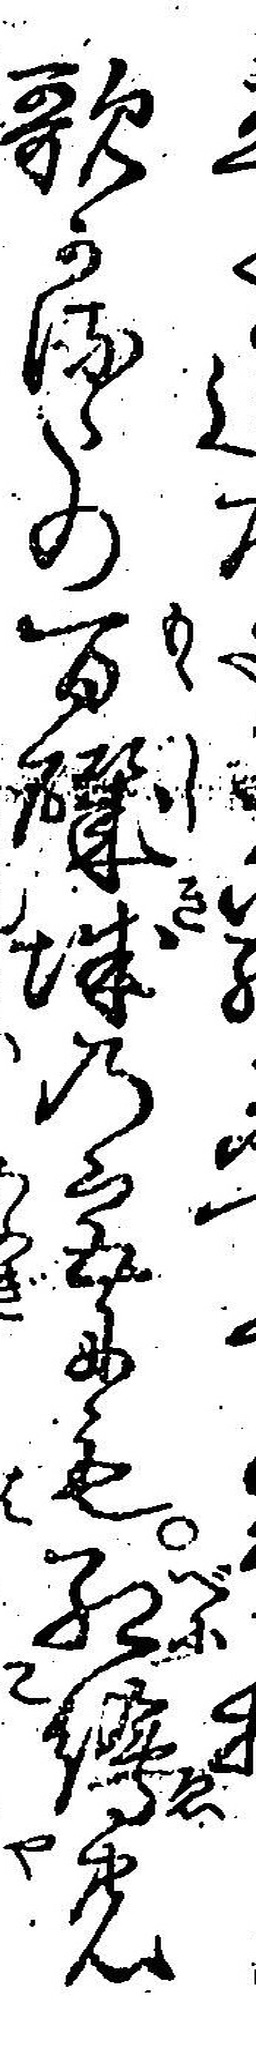歌かるたの百磯城の宮にも。紅絵の
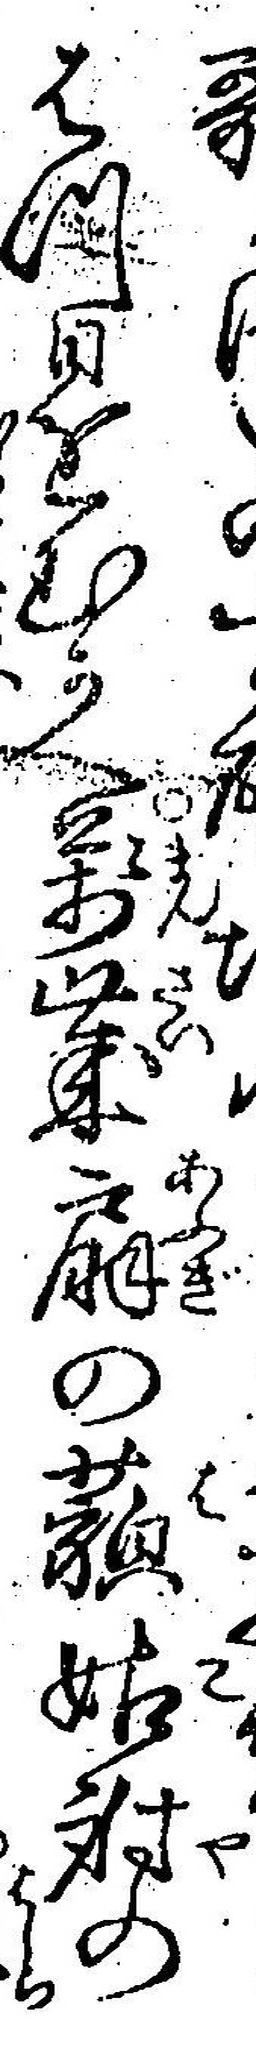はつ日をむかへ万歳扇の藐姑射の
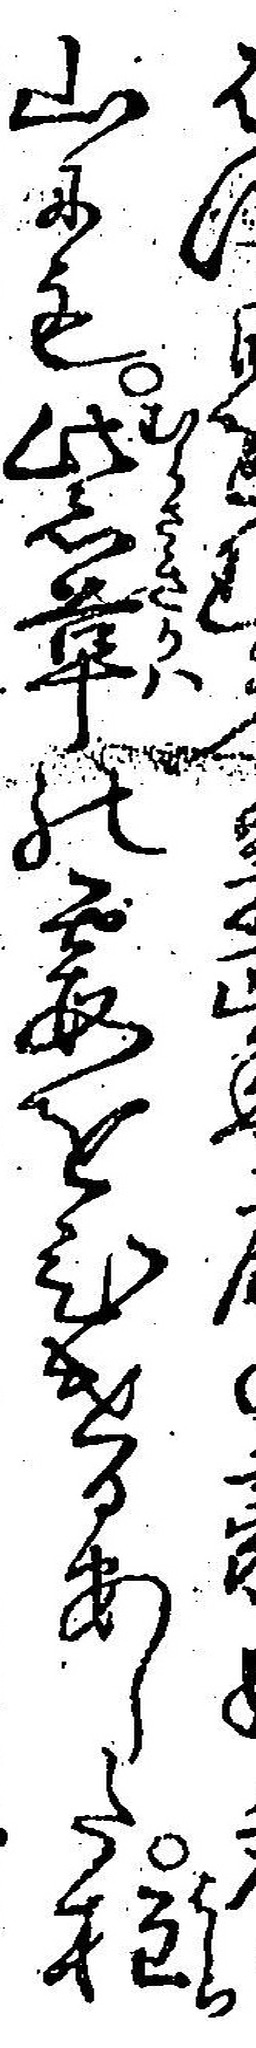山にも。紫革の露をひけるあした。柱
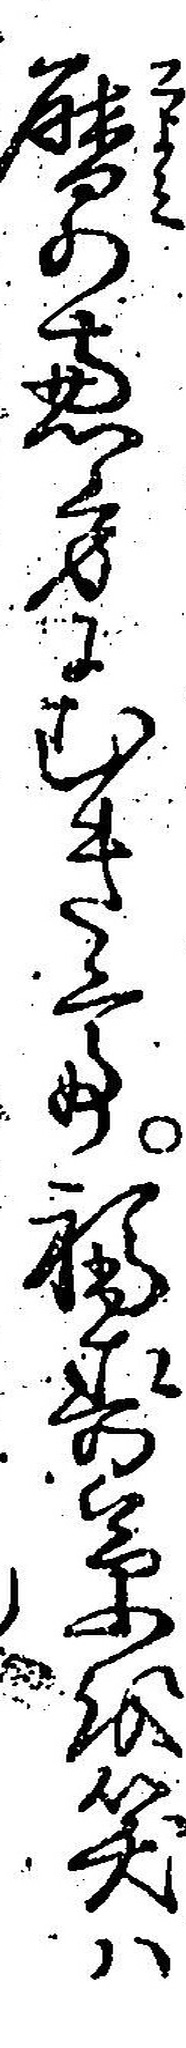暦の惣身にむきて。福寿草を笑は
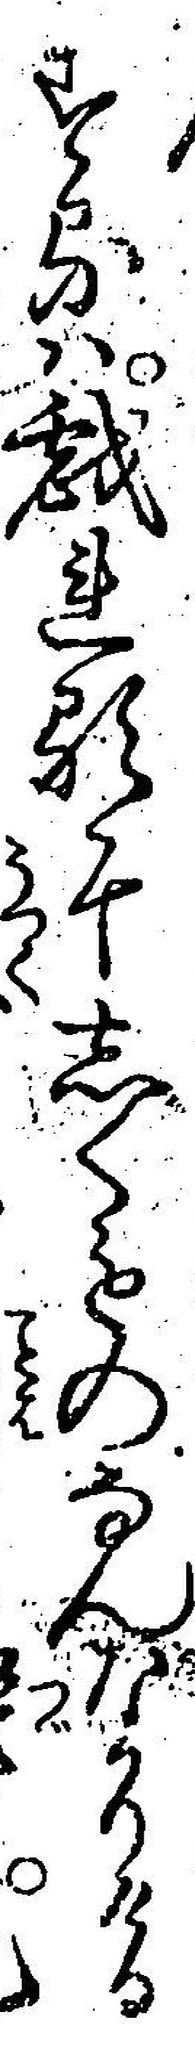するは。戯れるにしくものなんなかりける
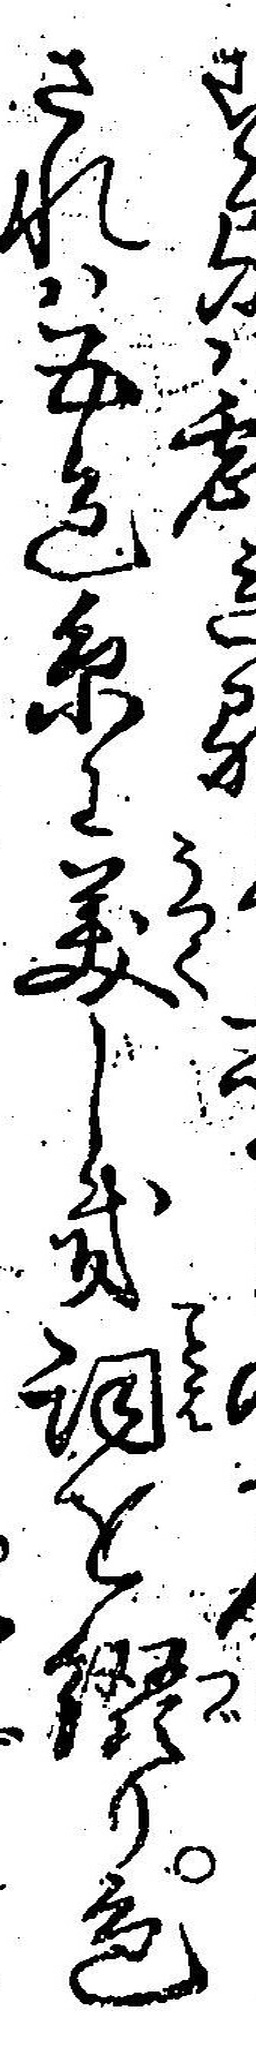されは五色糸に美しき詞を綴り。色
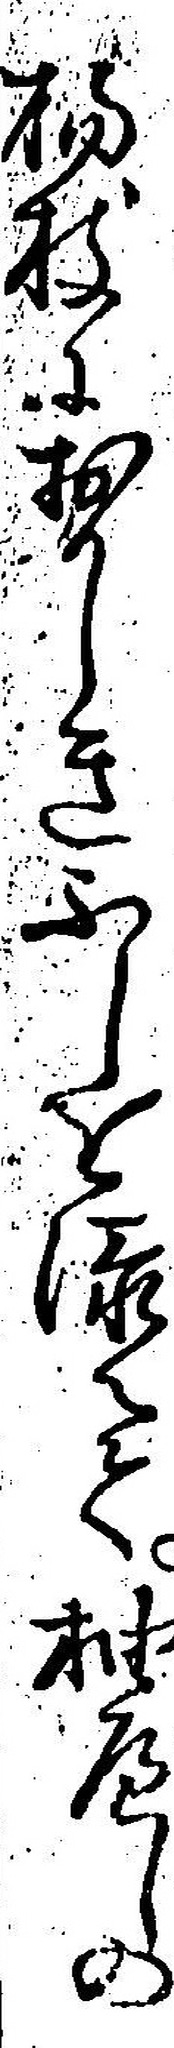楊枝におかしきふしを添へて。柚べしの
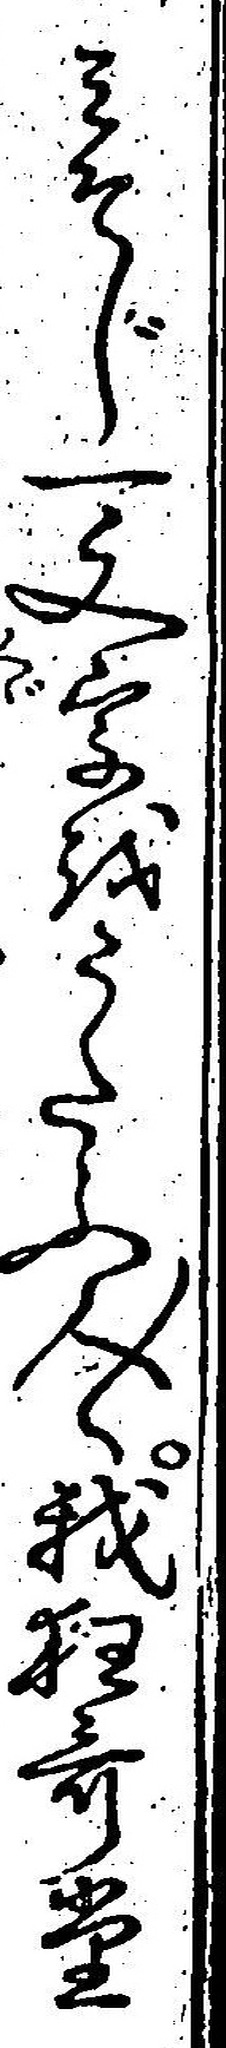みそじ一文字をうたふ人〳〵。我狂哥堂
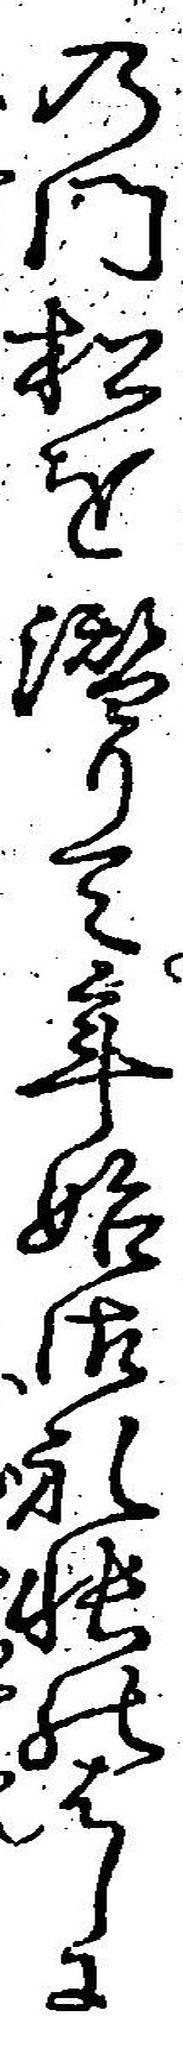の門松を潜りて。年始御礼帳のはしに
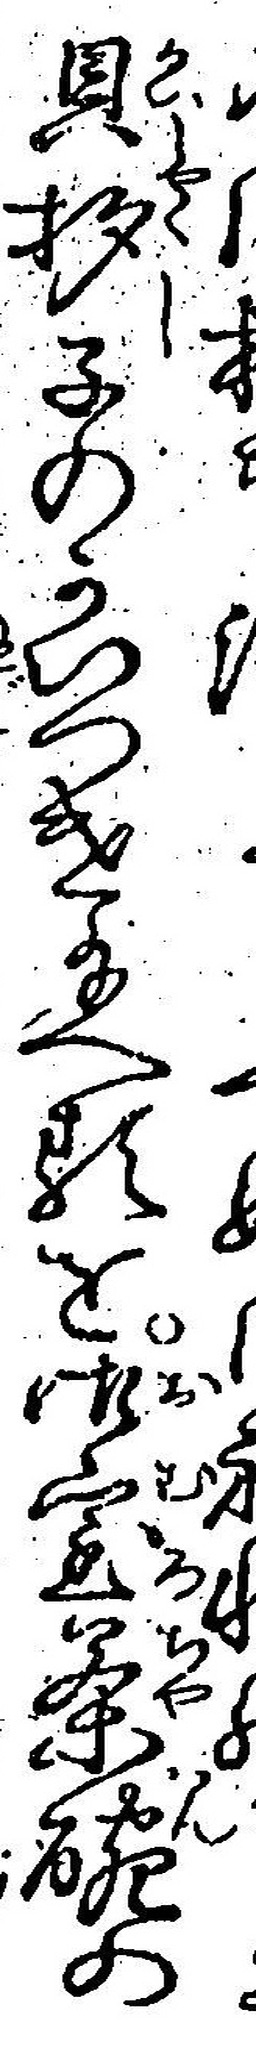貝杓子のかいつけ給へるを。御室茶碗の
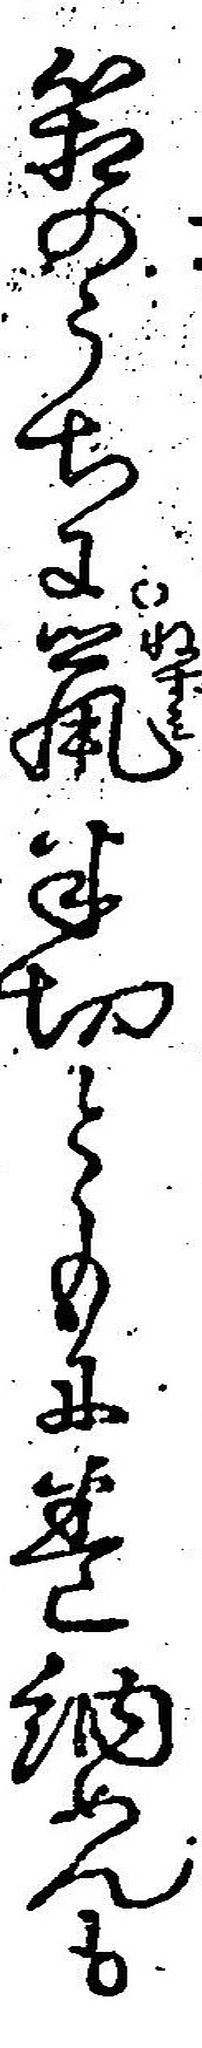箱のうちに。鼠半切ともに巻納めんも
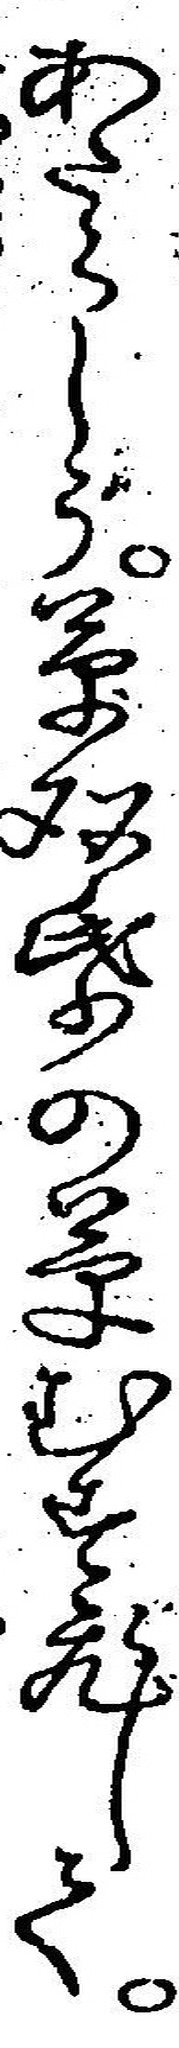あたらしう。草双紙の草むすびして。
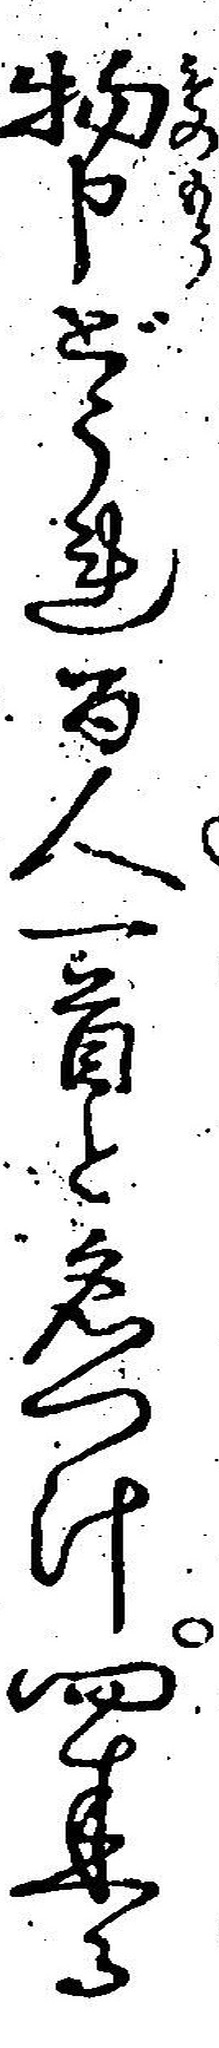物申どうれ百人一首と名つけ。問来る
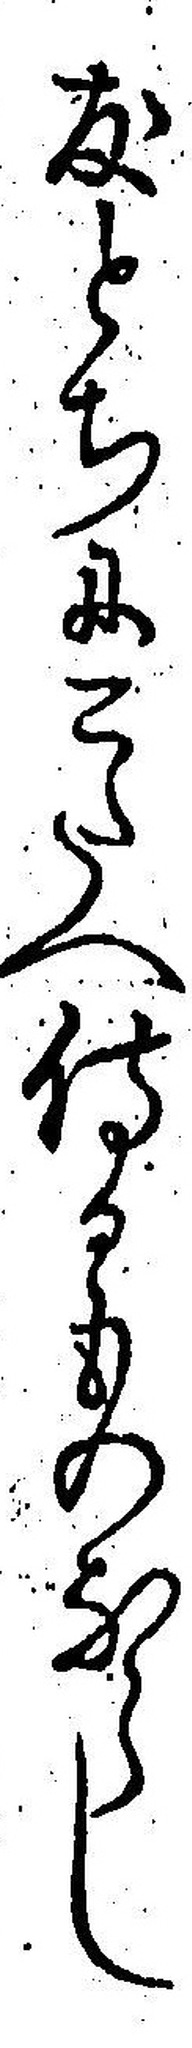友とちにこたへ侍るものならし
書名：どうれ百人一首 / 鹿都部真顔(狂歌堂)編
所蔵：東京大学総合図書館 General Library in the University of Tokyo, JAPAN
